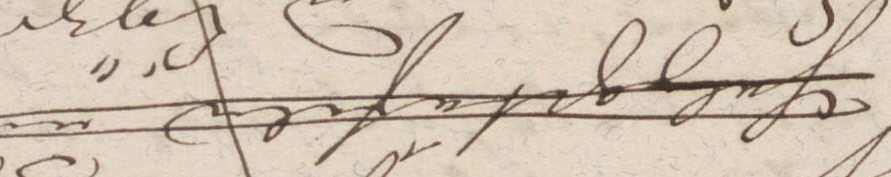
ich wünsche hier weder
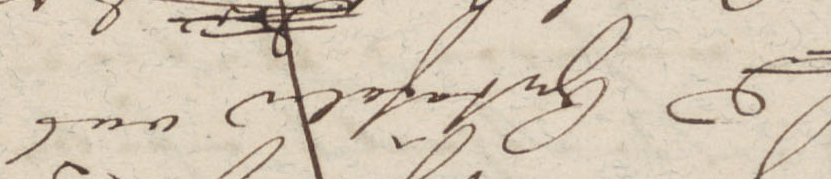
den Paragraphen über %
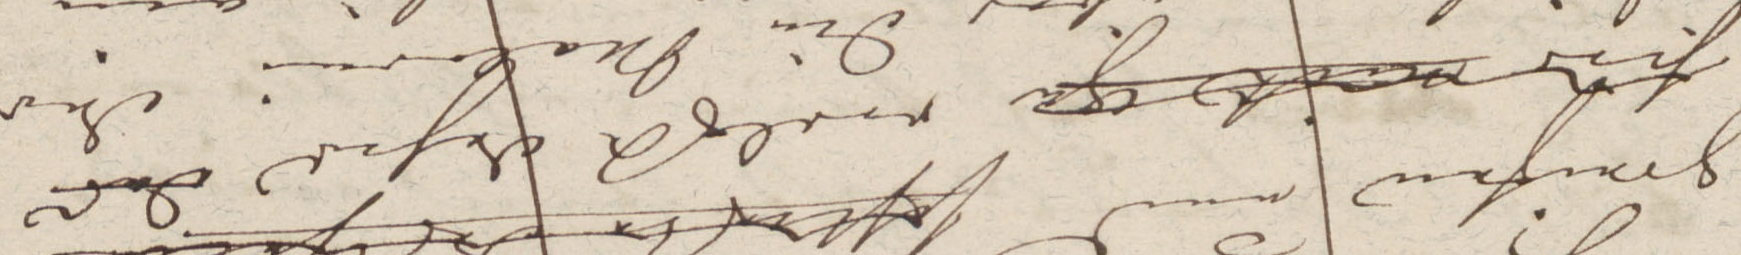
aus, dass die eigentlichen Prachtge-
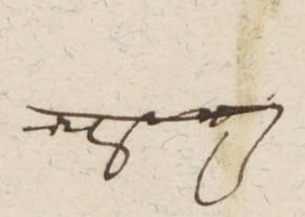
the der ohne
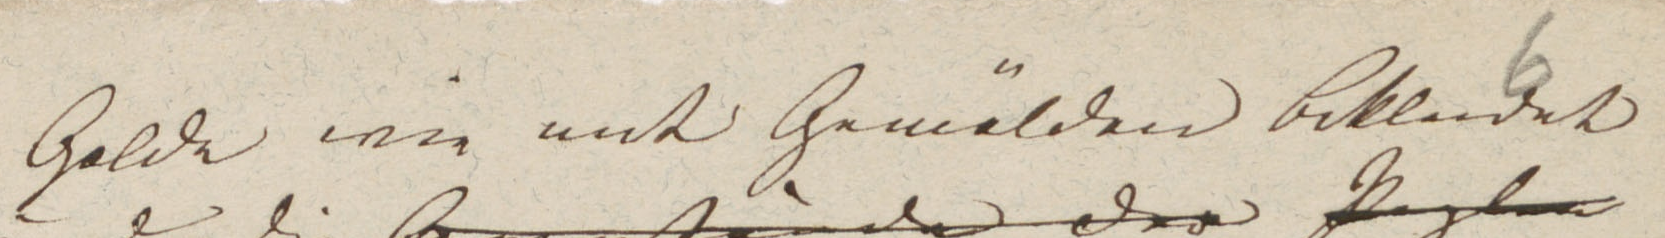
Golde wie mit Gemälden bekleidet
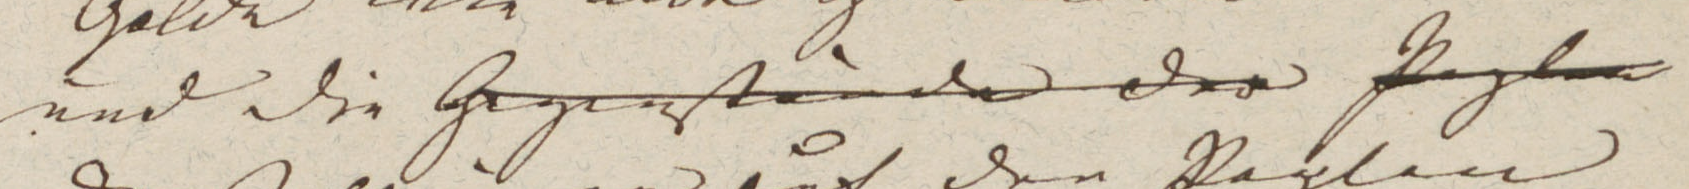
und die Gegenstände der Peplen
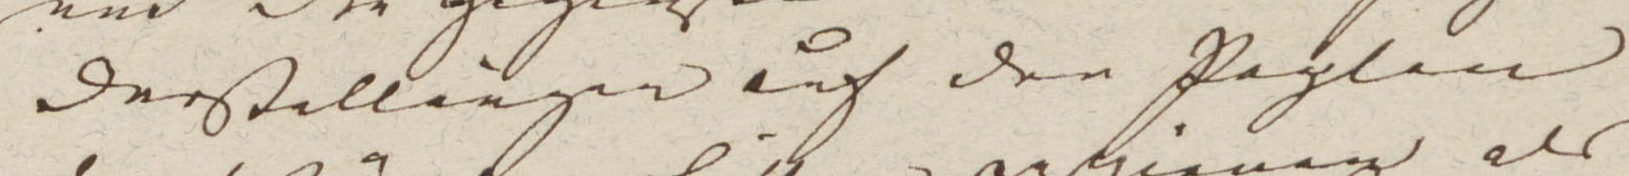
Darstellungen auf den Peplen
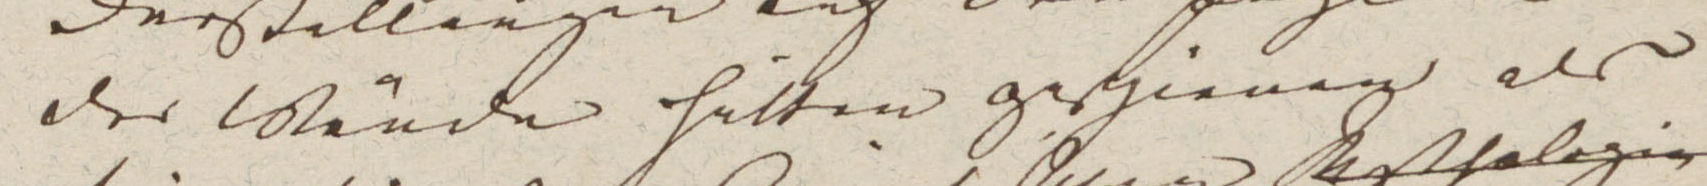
der Wände hätten geschienen als
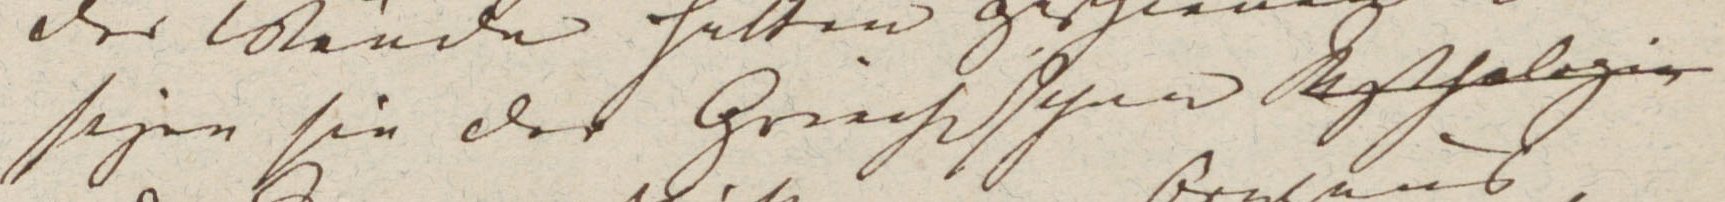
seyen sie der Griechischen Mythologie
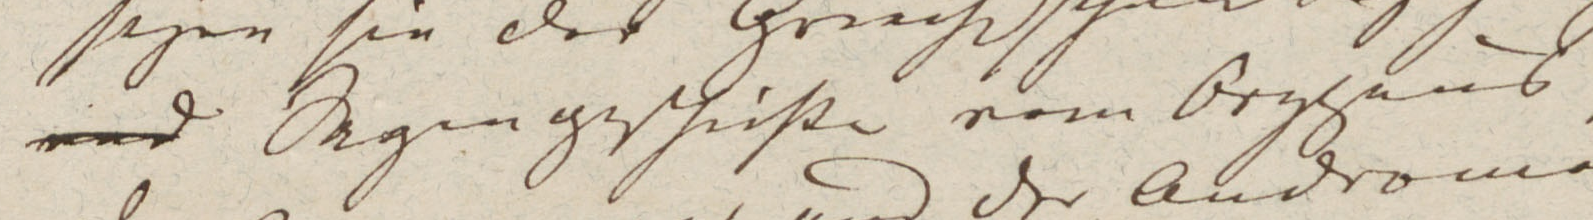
und Sagengeschichte vom Orpheus,
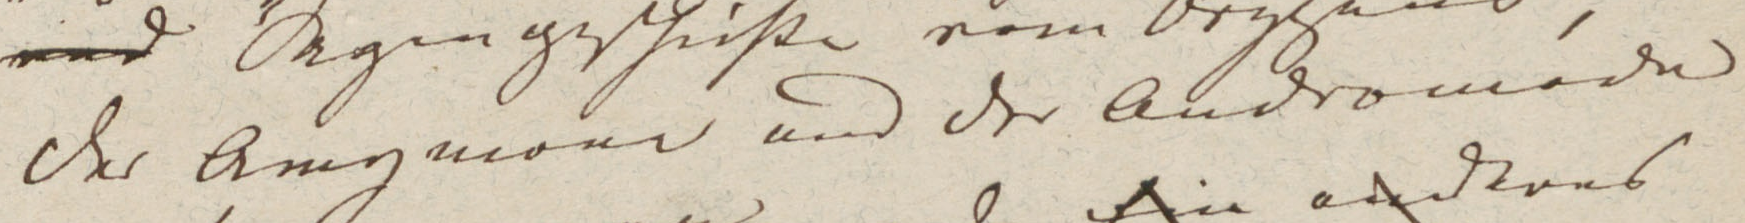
der Amymone und der Andromeda
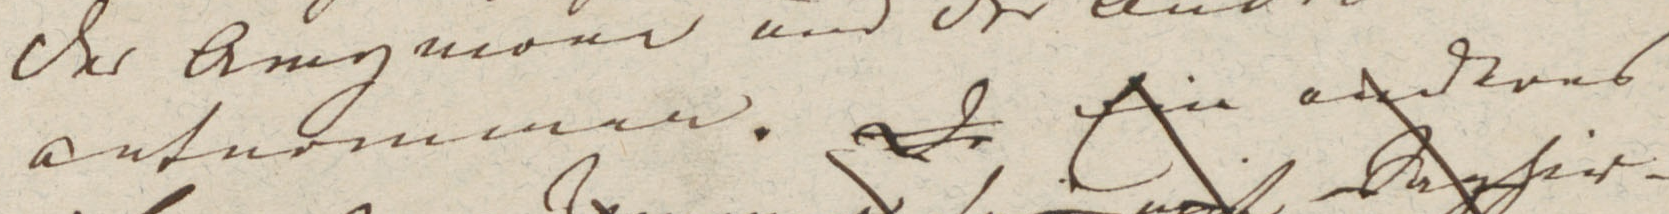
entnommen. D Ein anderes
